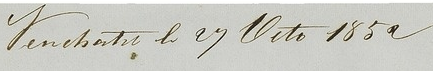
Neuchatel le 27 Octo 1852
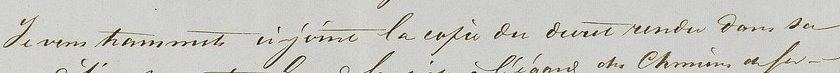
Je vous transmets ci-joint la copie du decret rendu dans sa
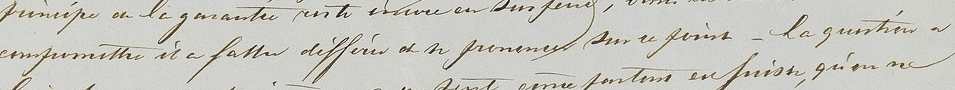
compromettre il a fallu différer et se prononcer sur ce point. La question a
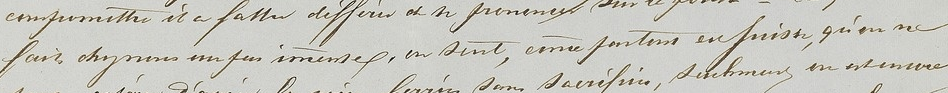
fait chez nous un pas immense, en tout, comme partout en Suisse, qu'on ne
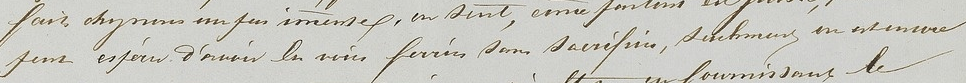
peut espérer d'avoir les voies ferrées sans sacrifice, seulement on est encore
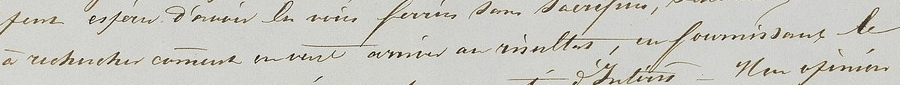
à rechercher comment on veut arriver au résultat, en fournissant le
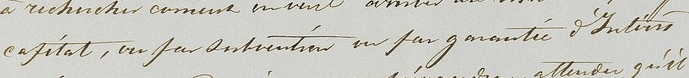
capital, ou par subvention ou par garantie d'Intéret.
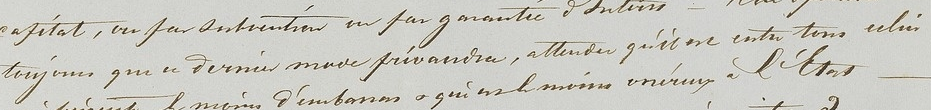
toujours que ce dernier mode prévaudra, attendu qu'il est entre tous celui
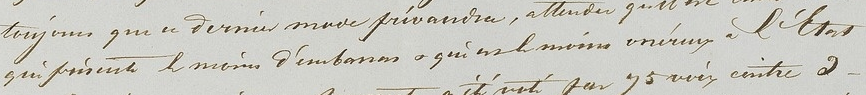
qui présente le moins d'embarras & qui est le moins onéreux à l'Etat.
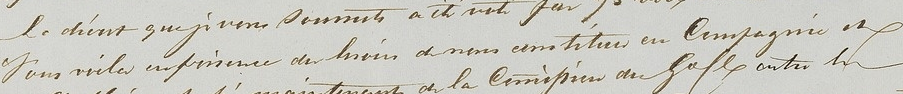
Nous voilà en présence du besoin de nous constituer en Compagnie et
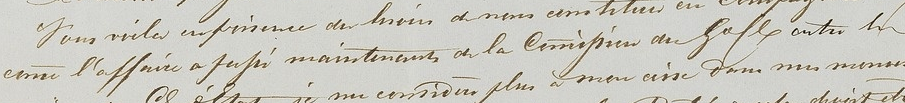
comme l'affaire à passé maintenant de la Commission du Gr Cl entre les
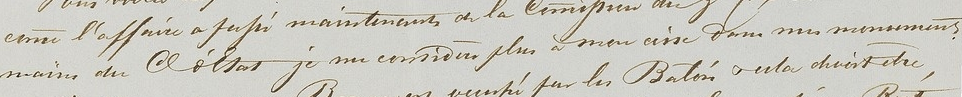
mains du Cl d'Etat je me considère plus à mon aise dans mes mouvements.
